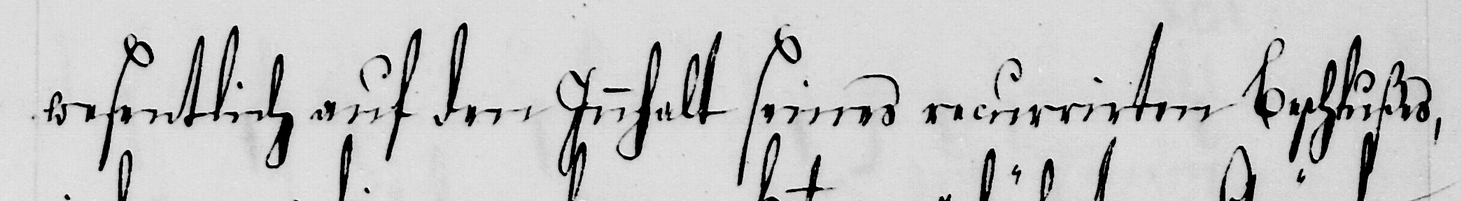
wesentlich auf den Inhalt seines recurrirten Beschlus¬
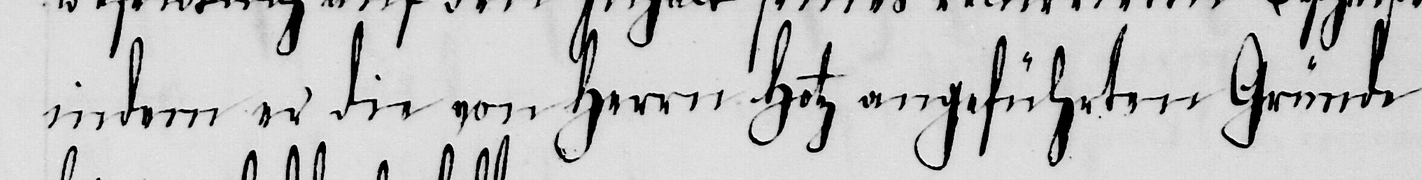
indem er die von Herrn Hotz angeführten Gründe
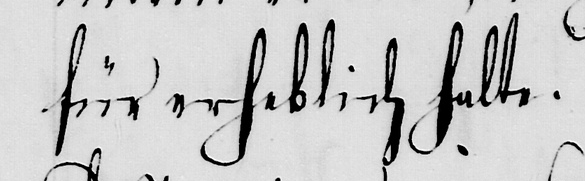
für erheblich halt¬
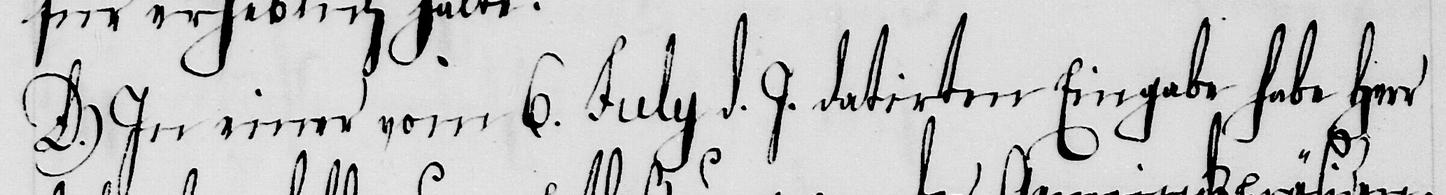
D.) In seiner vom 6. July d. J. datirten Eingabe habe Her¬
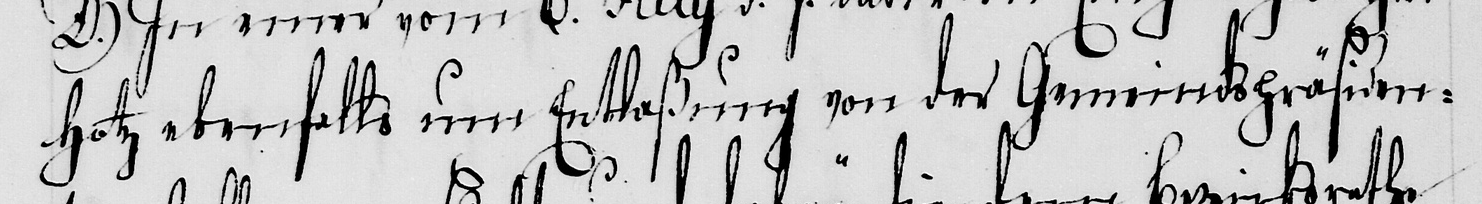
Hotz ebenfalls um Entlassung von der Gemeindspräsiden¬
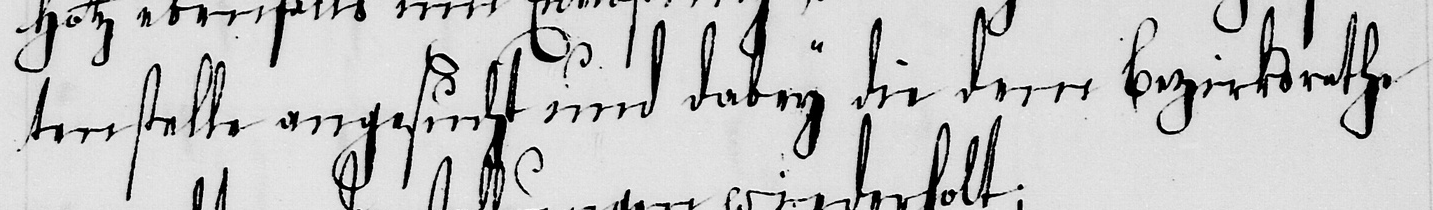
tenstelle angesucht und dabey die dem Bezirksrathe
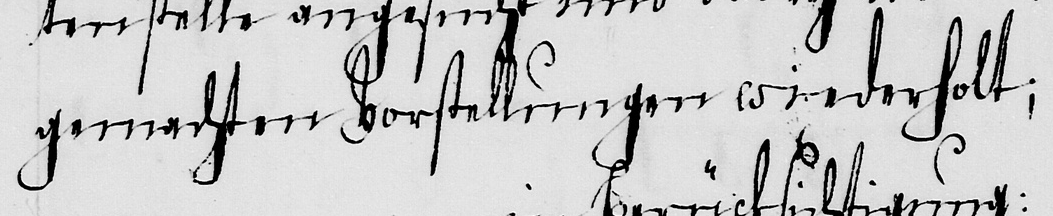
gemachten Vorstellungen wiederholt;
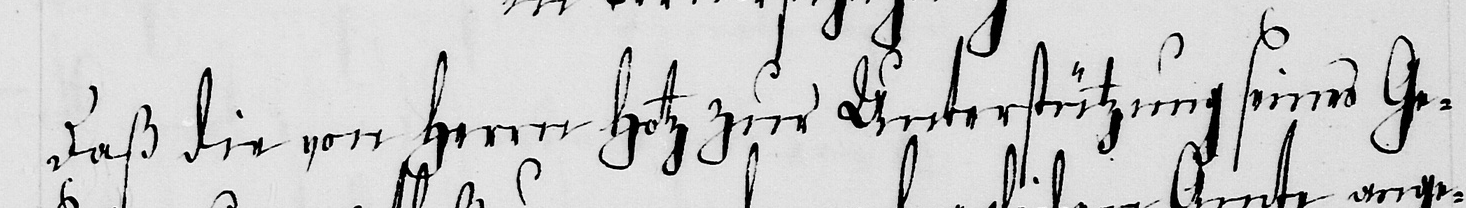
Daß die von Herrn Hotz zur Unterstützung seines Ge¬
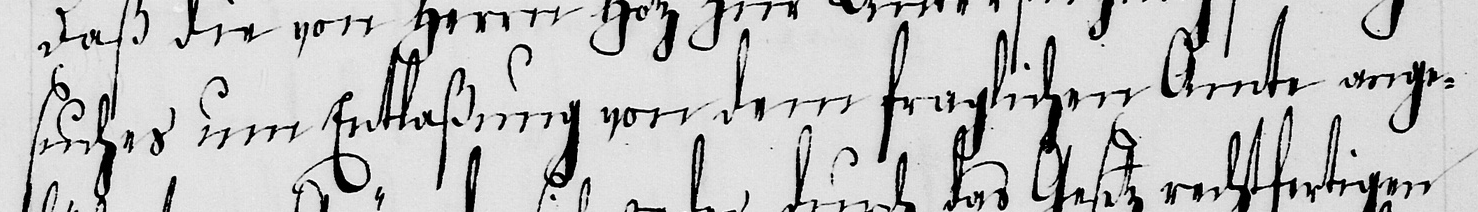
suches um Entlaßung von dem fraglichen Amte ange¬
